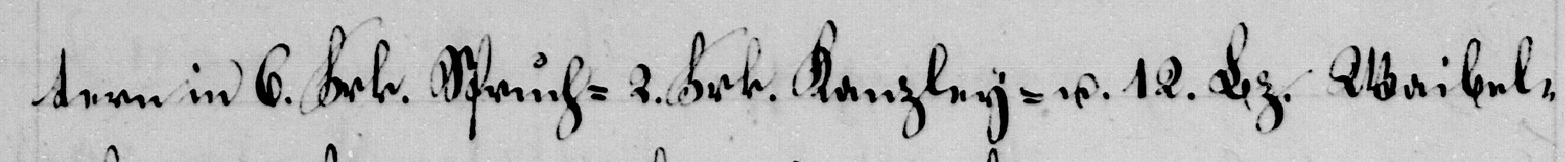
tern in 6. Frk. Spruch- 2. Frk. Kanzley- u. 12. Bz. Waibel¬
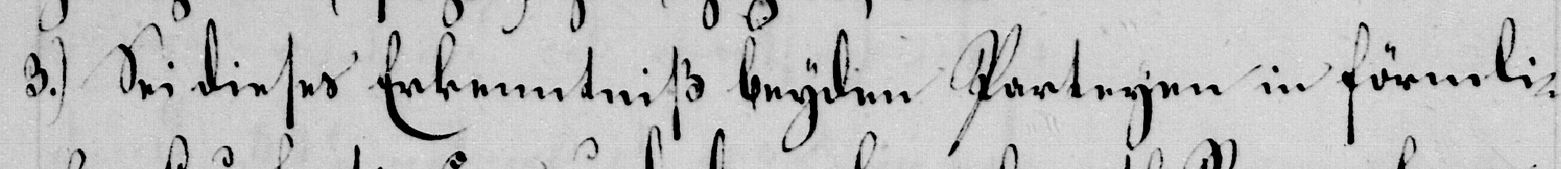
3.) Sei dieses Erkenntniß beyden Parteyen in förmli¬
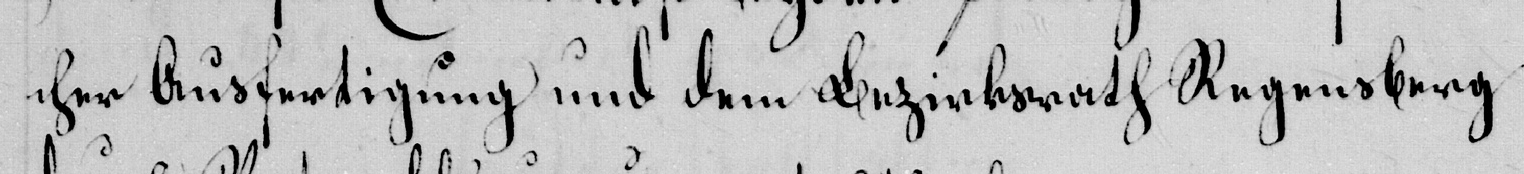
cher Ausfertigung und dem Bezirksrath Regensberg
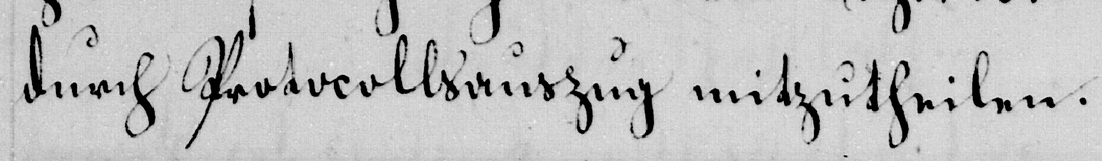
durch Protokollsauszug mitzutheilen.
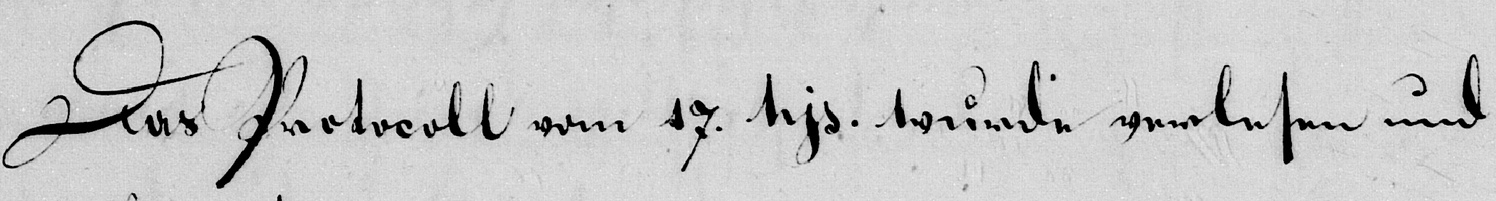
Das Protocoll vom 16. hjs. wurde verlesen und
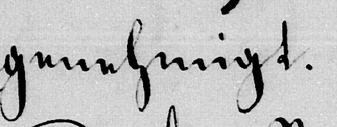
genehmigt.
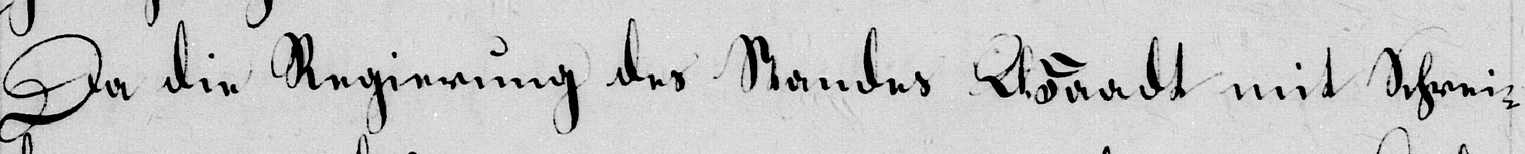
Da die Regierung des Standes Waadt mit Schrei¬
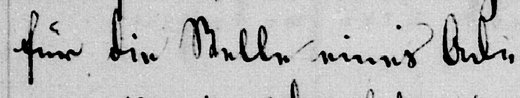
für die Stelle eines Ad¬
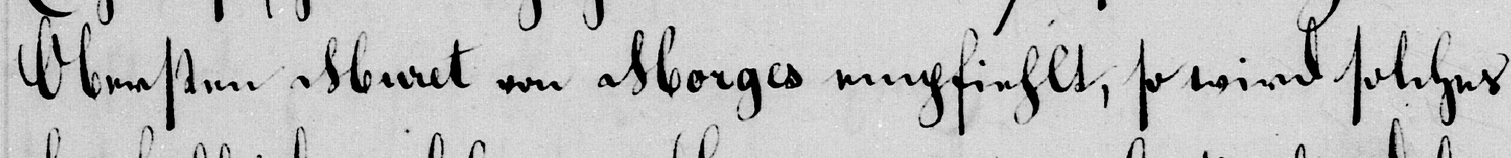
Obersten Muret von Morges empfiehlt, so wird solches
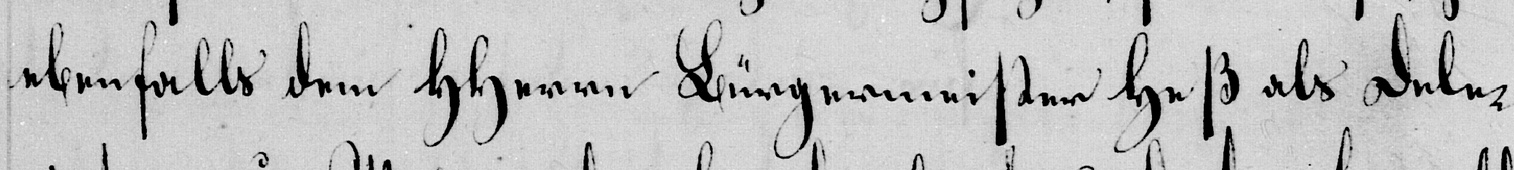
ebenfalls dem HHerrn Bürgermeister Heß als Dele¬
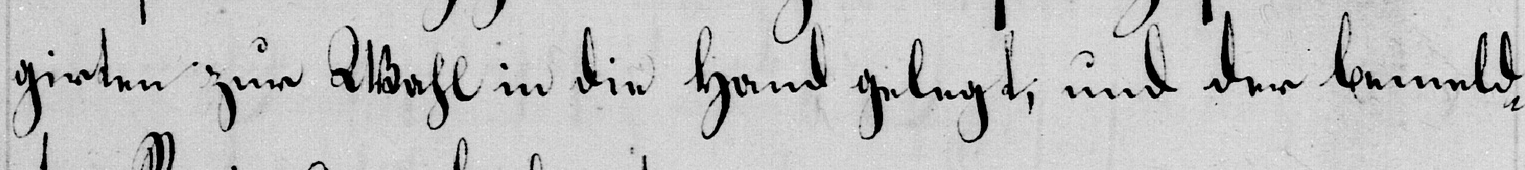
girten zur Wahl in die Hand gelegt, und der bemeld¬
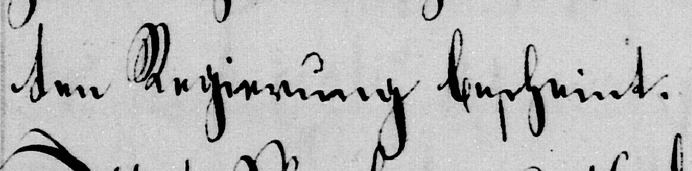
eten Regierung bescheint.
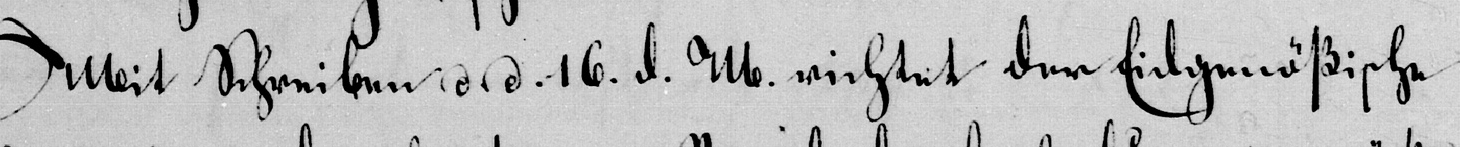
Mit Schreiben d. d. 16. d. M. richtet der Eidgenößische
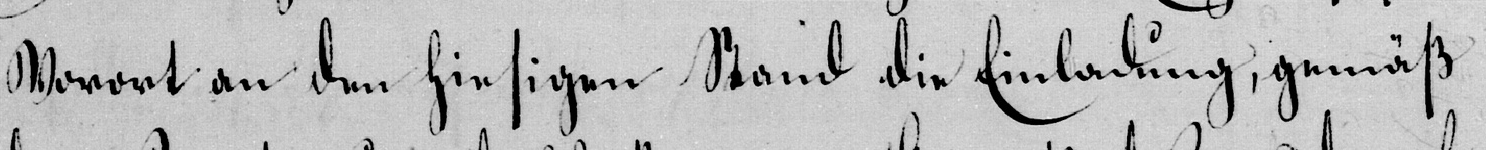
Vorort an den hiesigen Stand die Einladung, gemäß
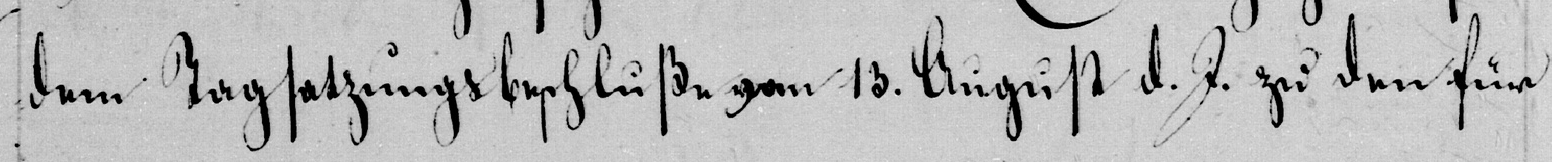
dem Tagsatzungsbeschluße vom 13. August d. J. zu den für
